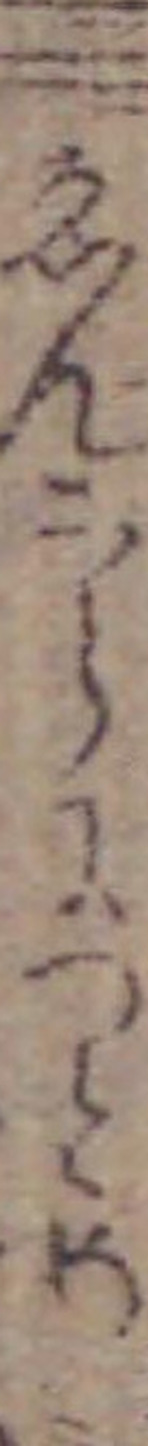ゑん二郎につとめ
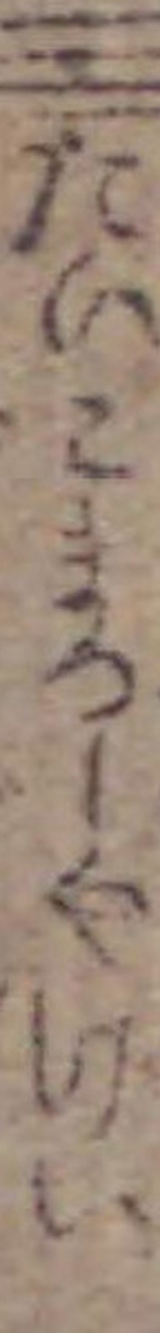たいこまつしやげい
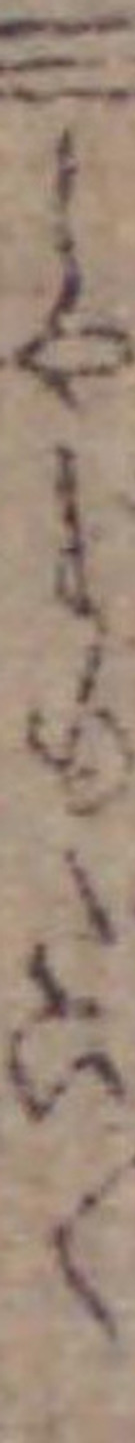しやどもだい〳〵
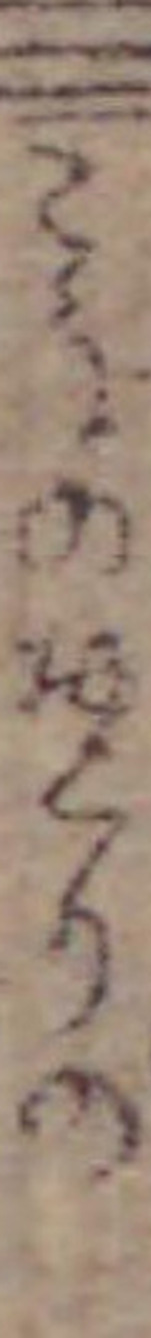こうのおくりの
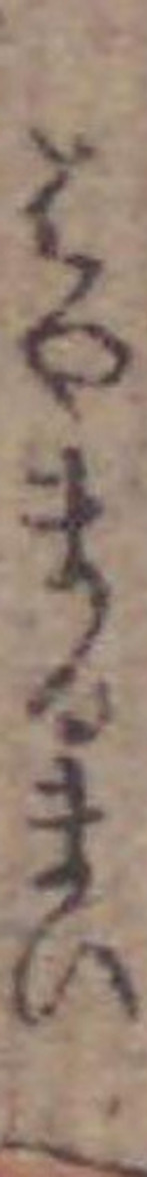はやまるまい
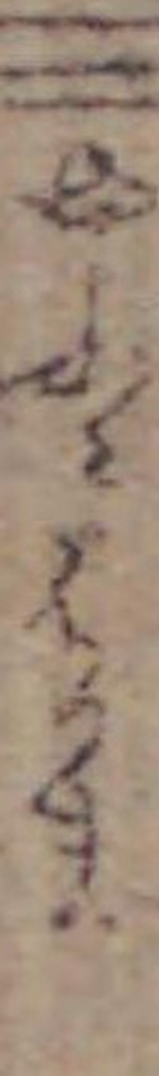やふにはかま
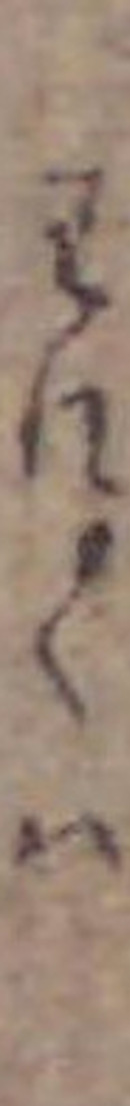われ〳〵は
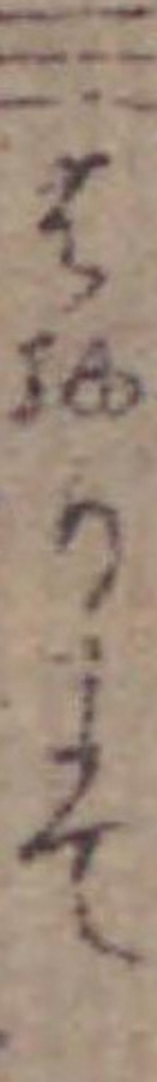はおりにて
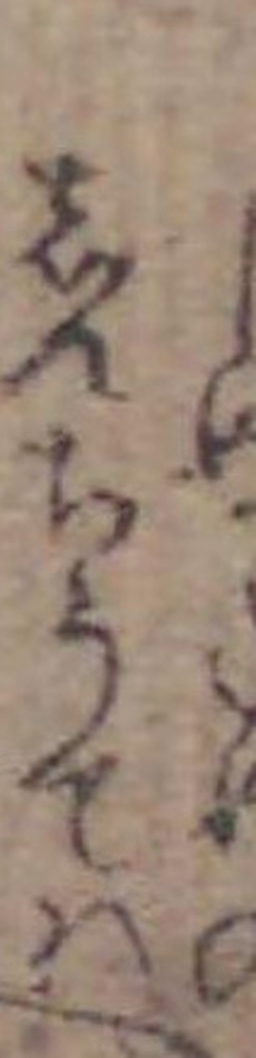しんちうては
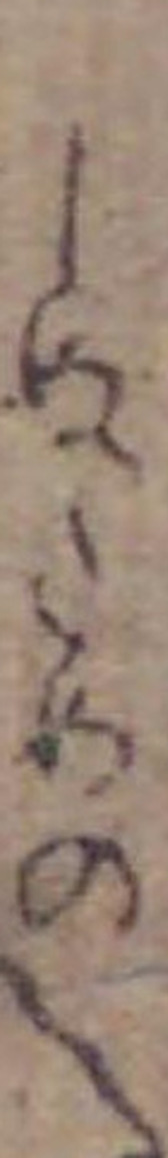しぬための
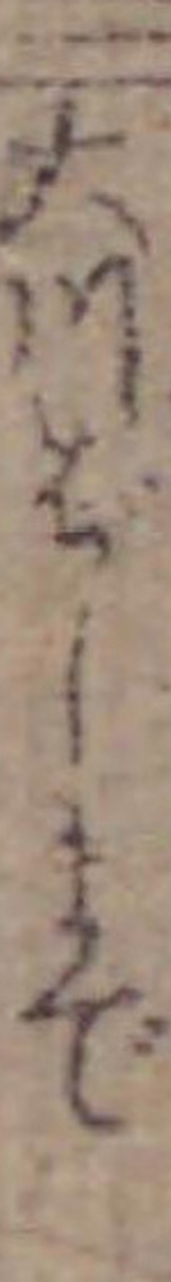大川ばしまで
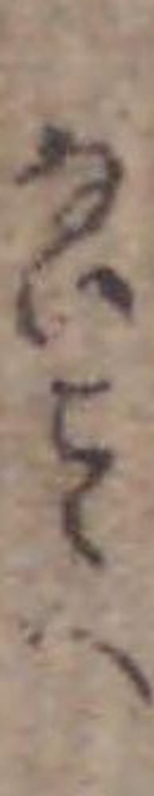ないこゝへ
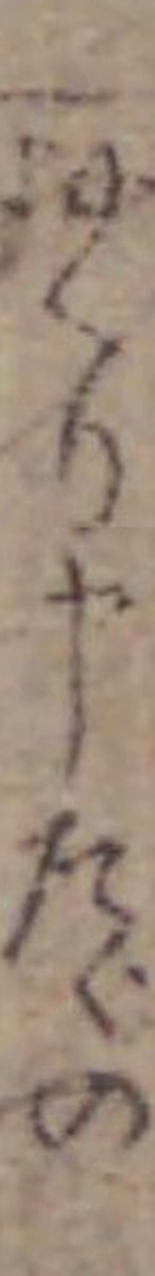おくり申たゞの
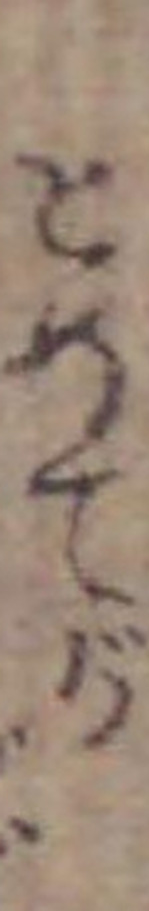とめてが
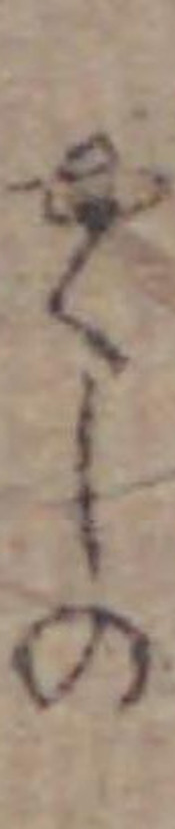やくしの
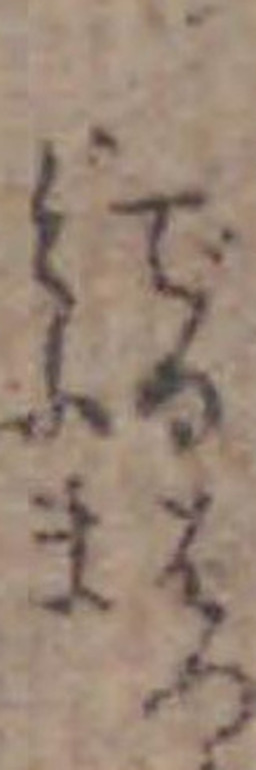どふま
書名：江戸生艶気樺焼 : 3巻
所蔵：国立国会図書館 National Diet Library, JAPAN
